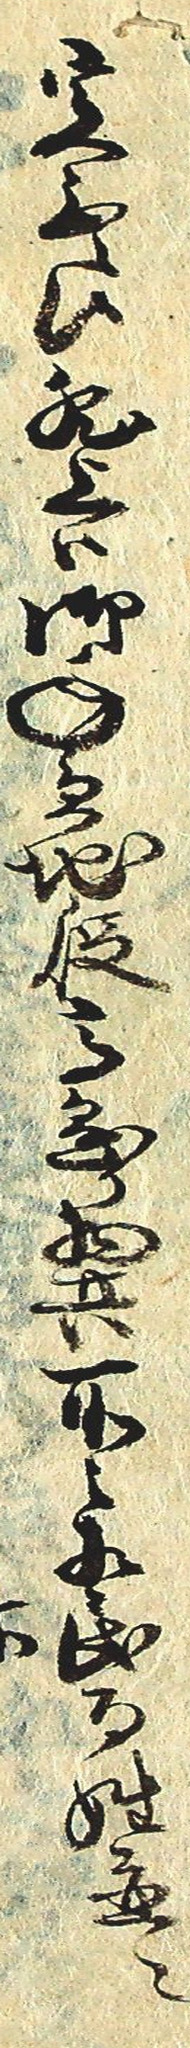実正に候然上は御年貢地役高懸り物共所之相当百姓並に
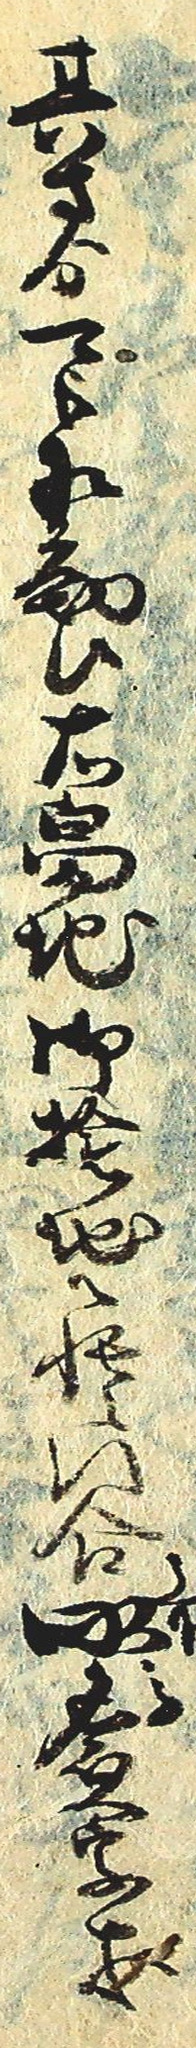其方ゟ可被相勤候右畠地御検地御帳に引合申所畝高名負字等
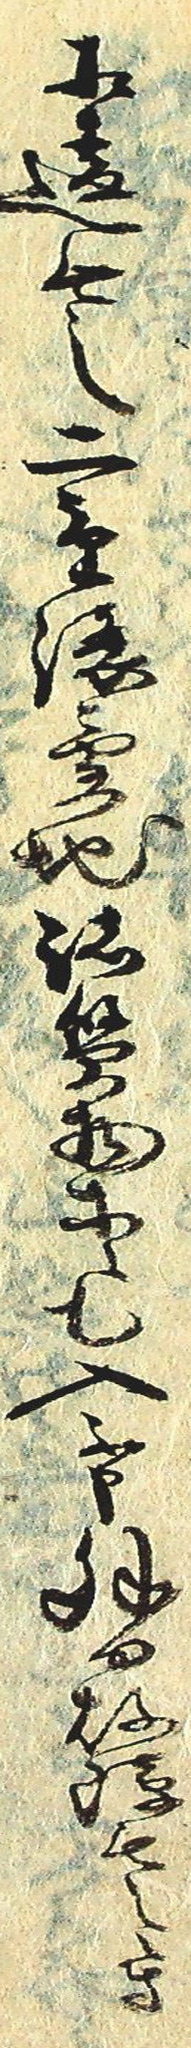相違無之二重譲売地諸質物等にも入不申外ゟ故障無之に付
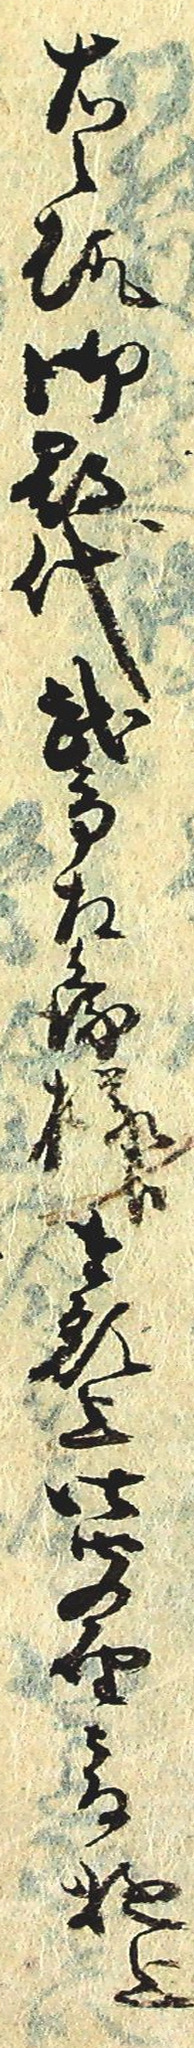右之趣御郡代武市左兵衛様え奉願上御聞届被為遊上
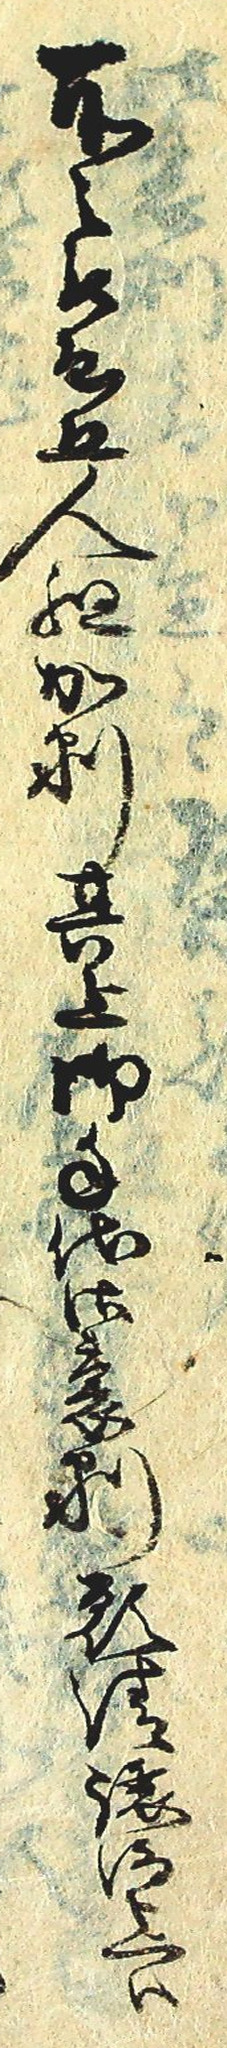所之庄屋五人組加判其上御手代御裏判願請譲渡上は
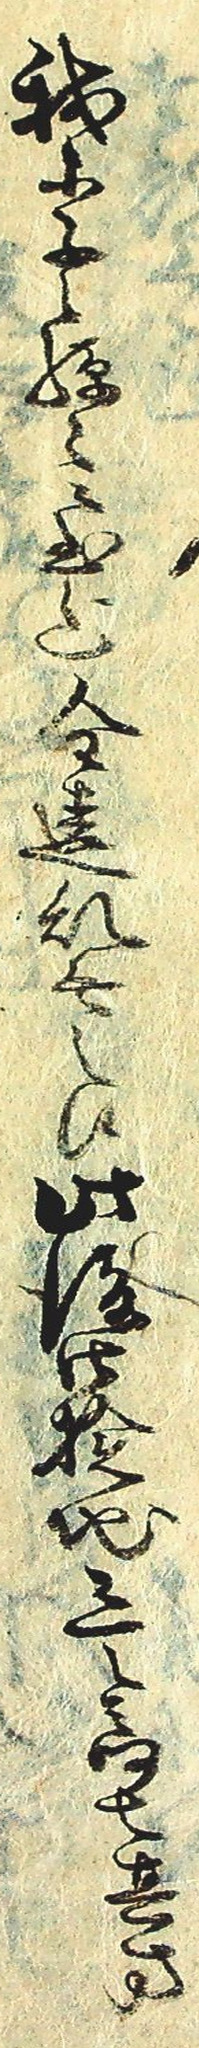我等子々孫々に至迄全違乱無之候此後御検地有之節は其方
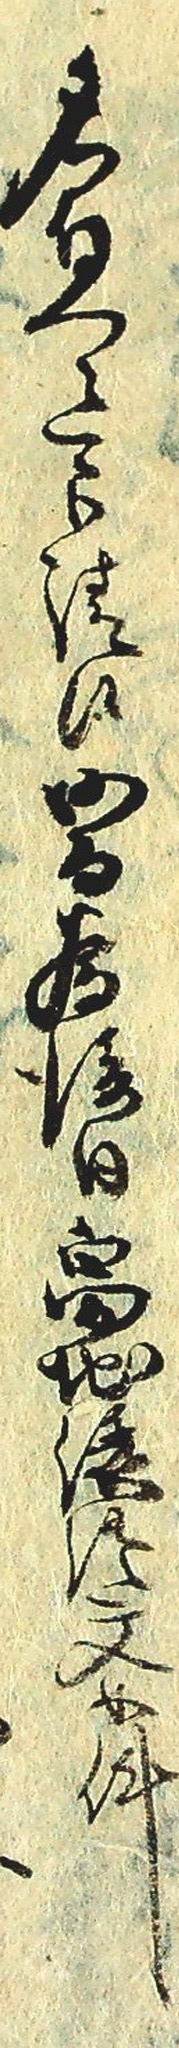名負に可被請候仍て為後日畠地譲証文如件
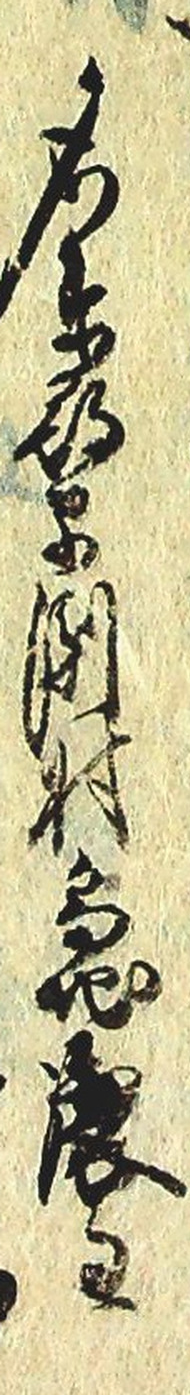名東郡早淵村畠地譲主
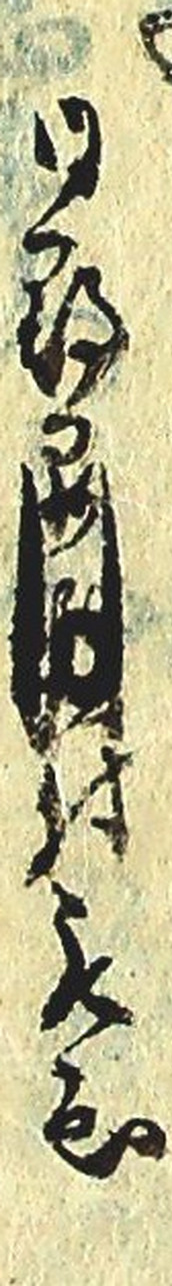同郡同村庄屋
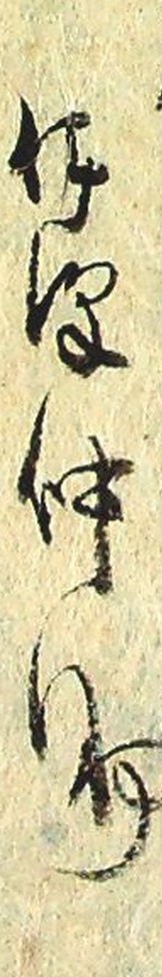伊沢仲助
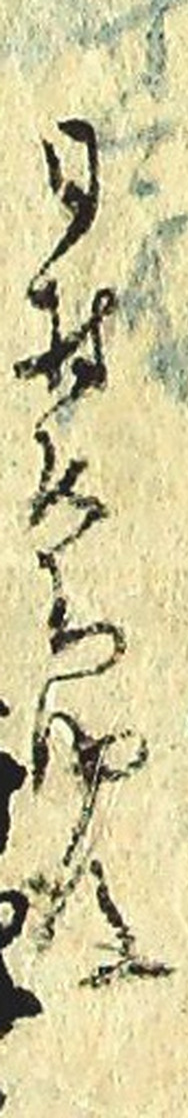同村庄屋助役
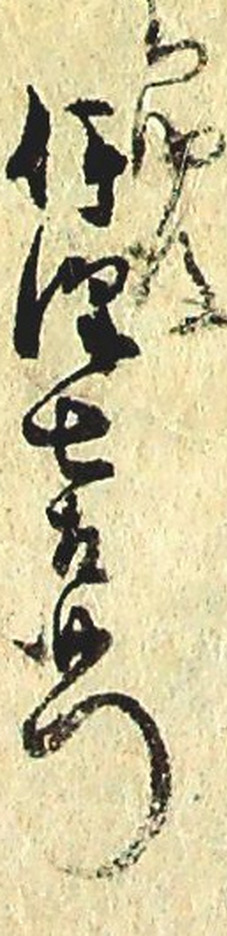伊沢七左衛門
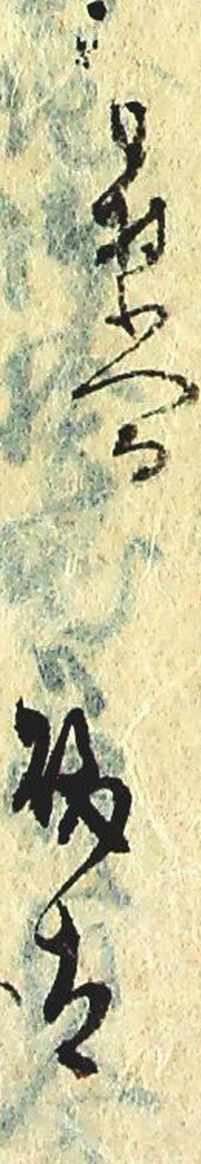同村五人与磯太
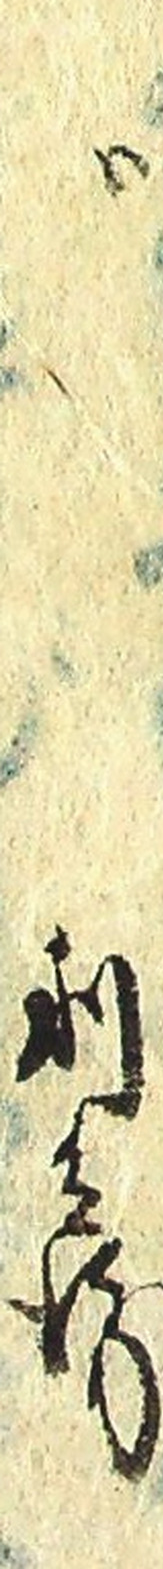同利兵衛
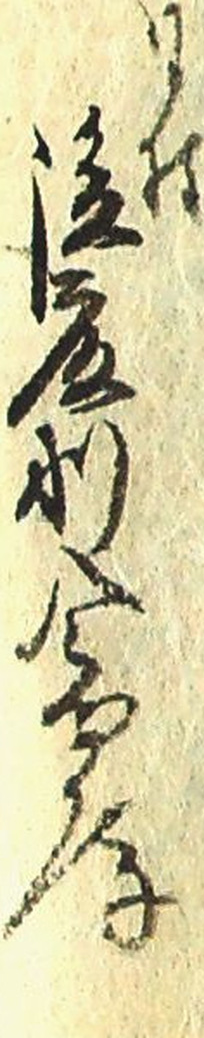後藤利八郎殿

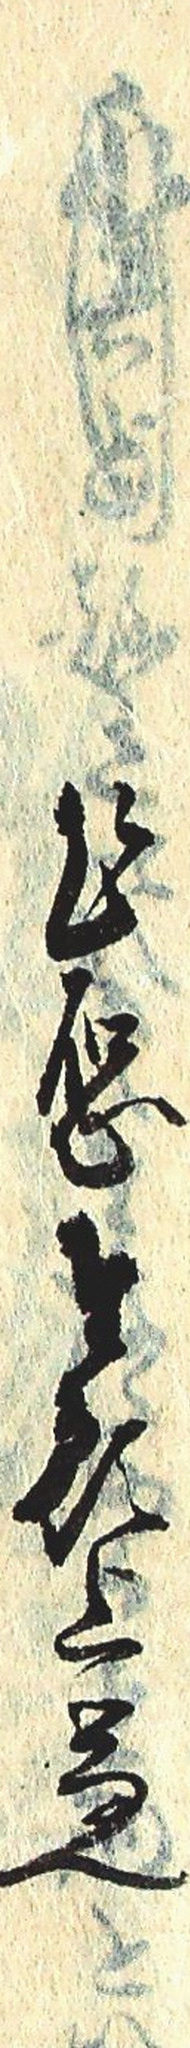乍恐奉願上覚
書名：諸御願書控(弐番）
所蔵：鳴門教育大学 Naruto University of Education
